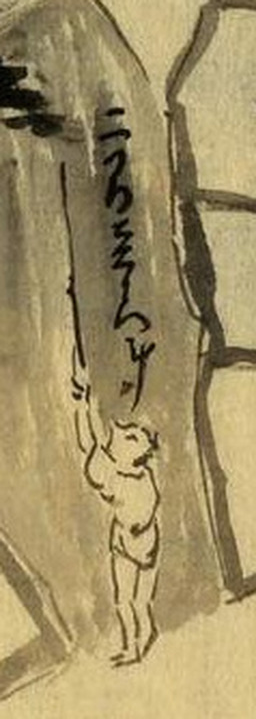二間壱尺斗
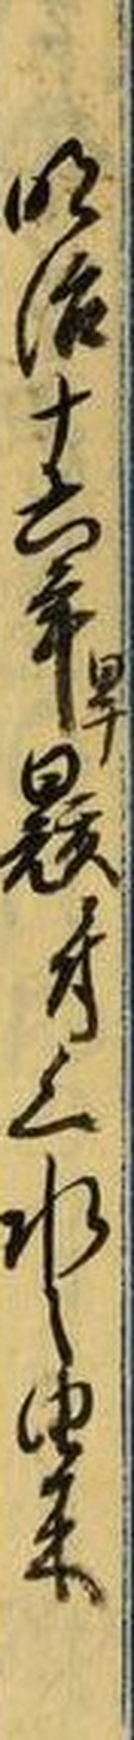明治十六年旱魃に付上水之由来
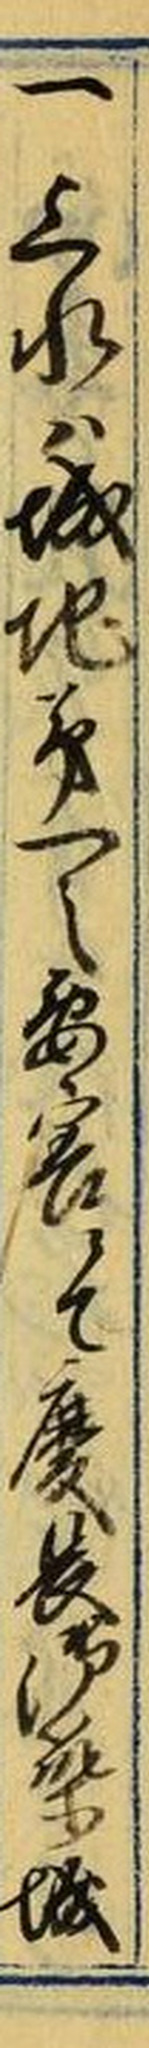一上水は城地第一之要害にて慶長御築城
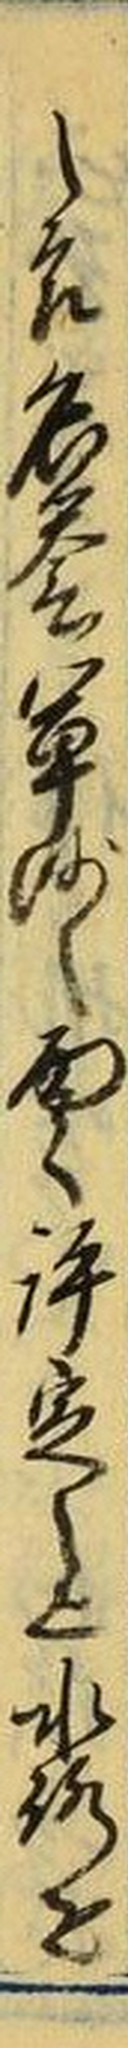之節名誉軍師之面々評定之上水路を
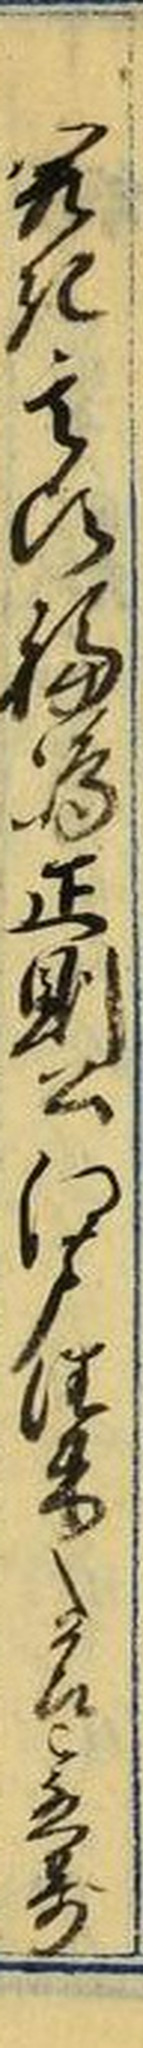開き其頃福嶋正則公江戸往来之節被立寄
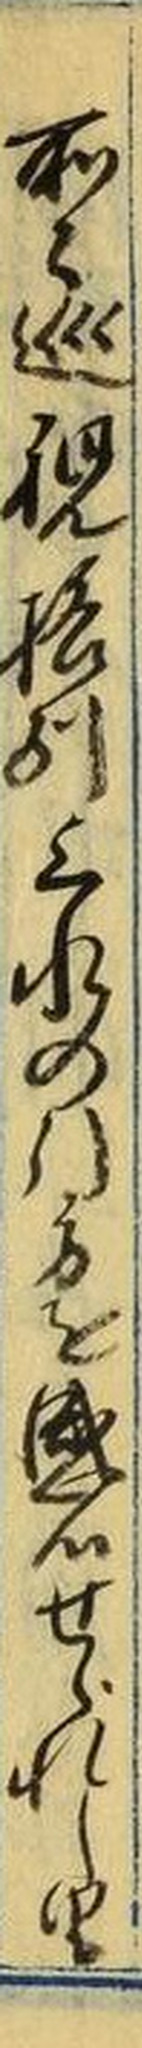所々巡視格別上水の引方を感心せられし由
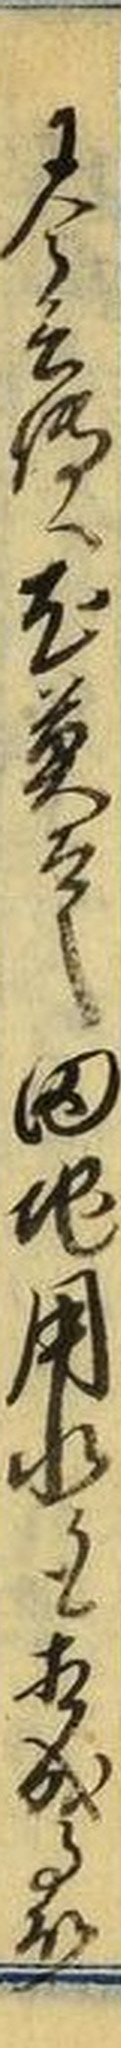于今言伝へ尤莫太之田地用水とも相成事故
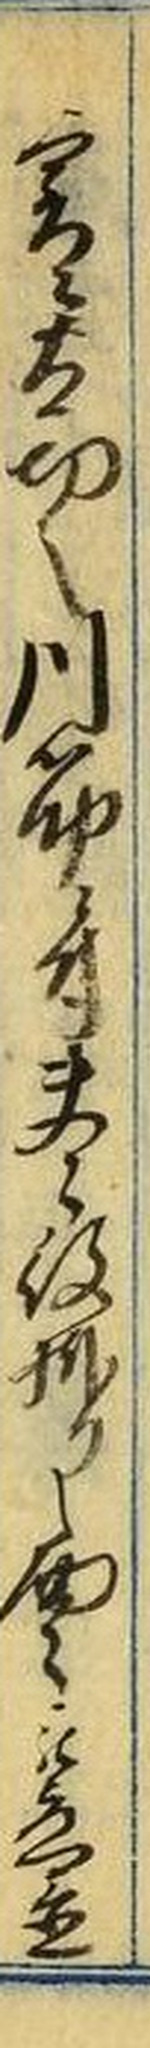実に太切之川筋に付夫々役掛り之面々被差置
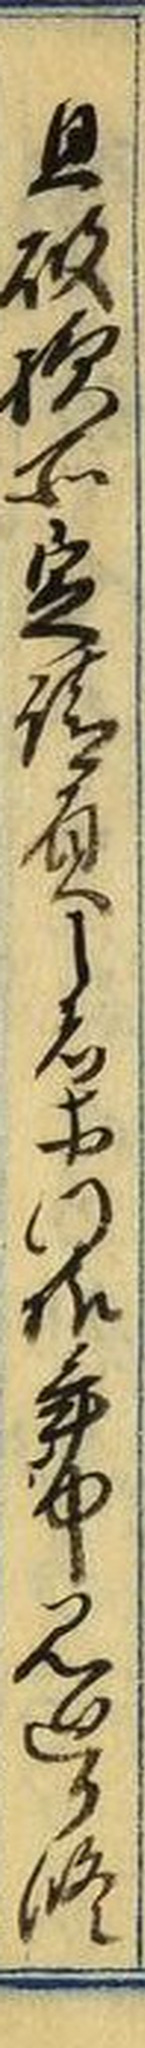且破損所定請負之者等同様年中見廻り修
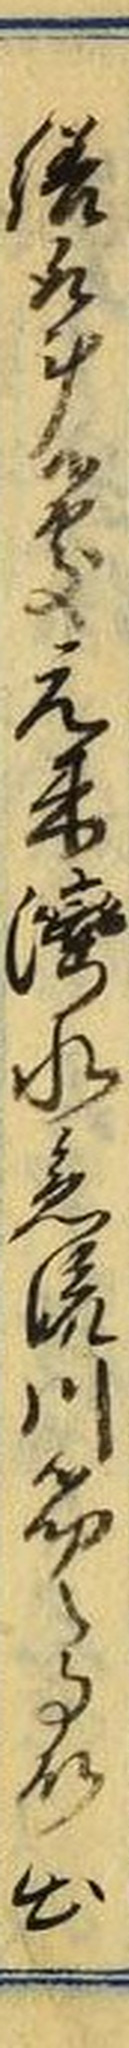繕取計候処元来灤水急流川筋之事故出
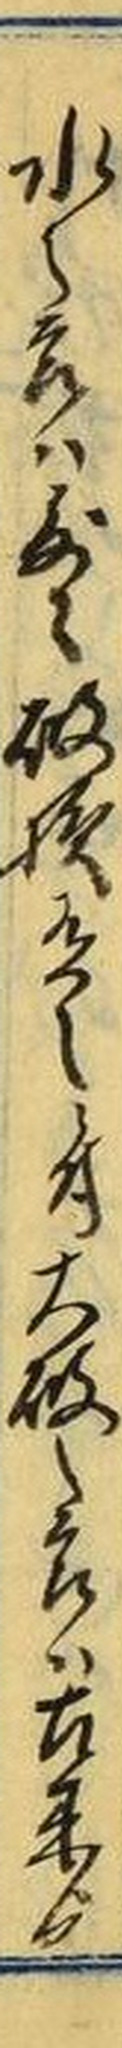水之節は度々破損有之に付大破之節は古来ゟ

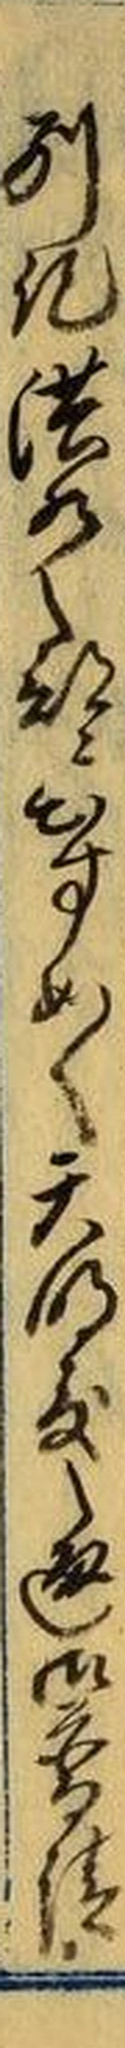別記洪水之部に出す如く天明度之通御普請
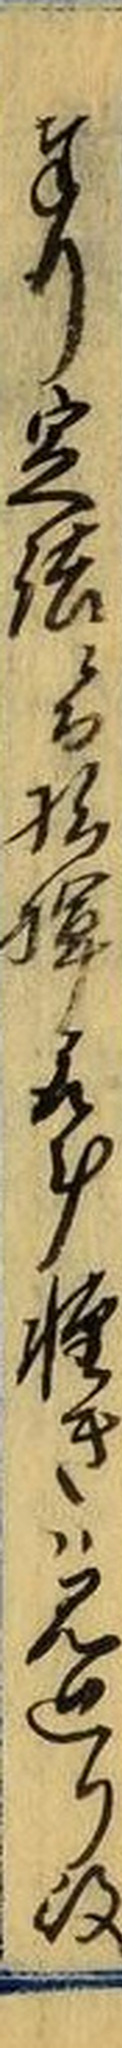奉行定詰に而指揮取計軽きは見廻り役
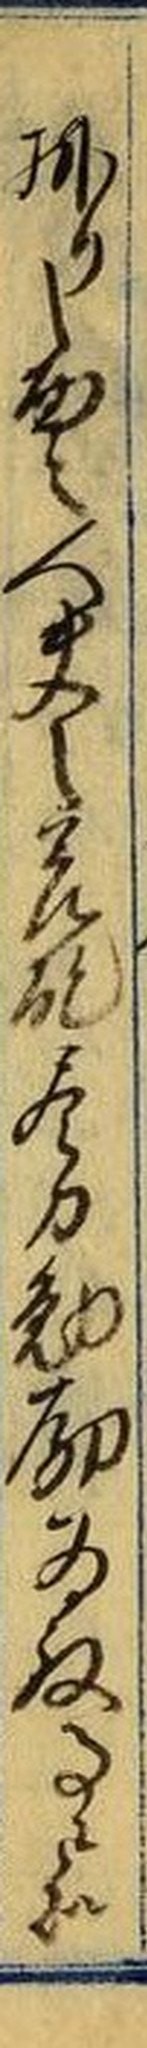掛り之面々人夫之差配尽力勉励為致事に候処
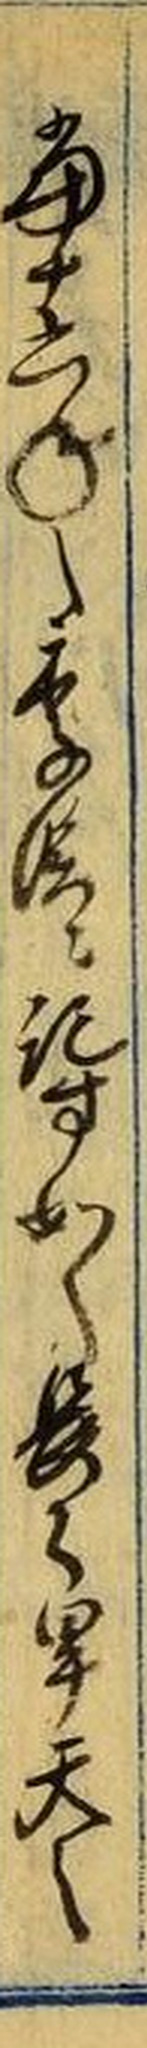当十六年之季候に記す如く長々旱天之
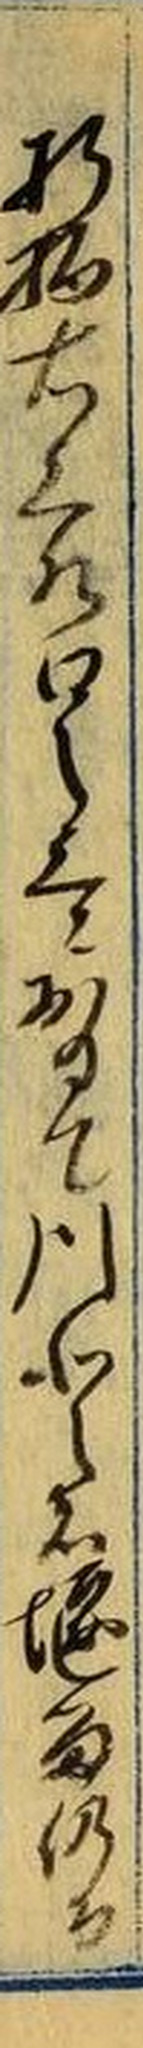折柄右上水口之上におゐて川北之者堰留仍而
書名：温古集 五巻
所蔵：福井県文書館 Fukui Prefectural Archives
